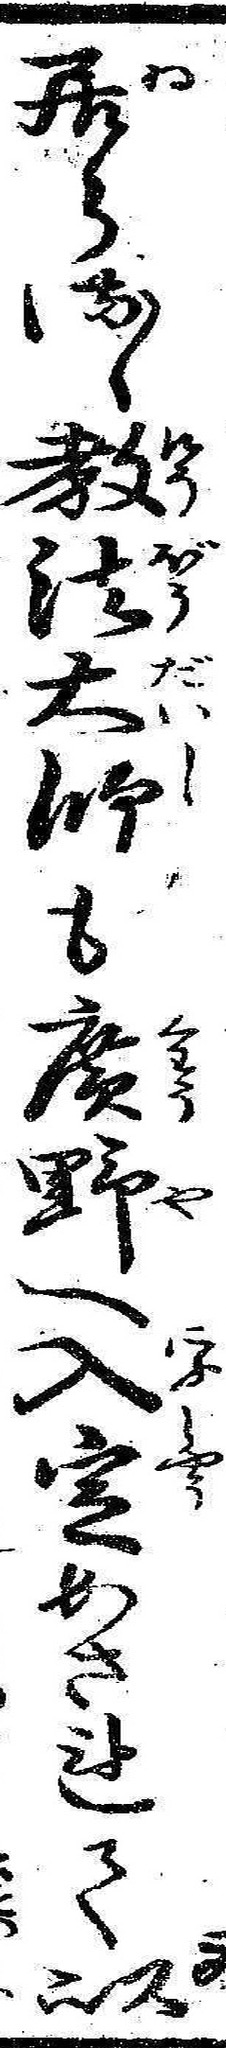居らるゝ教法大師も広野へ入定めされて以
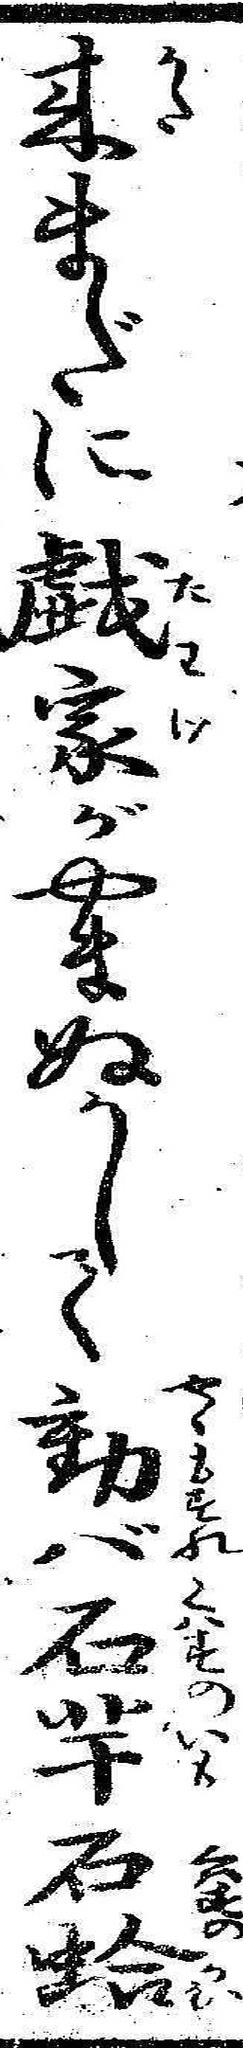来まだに戯家がやまぬかして動ば石芋石蛤
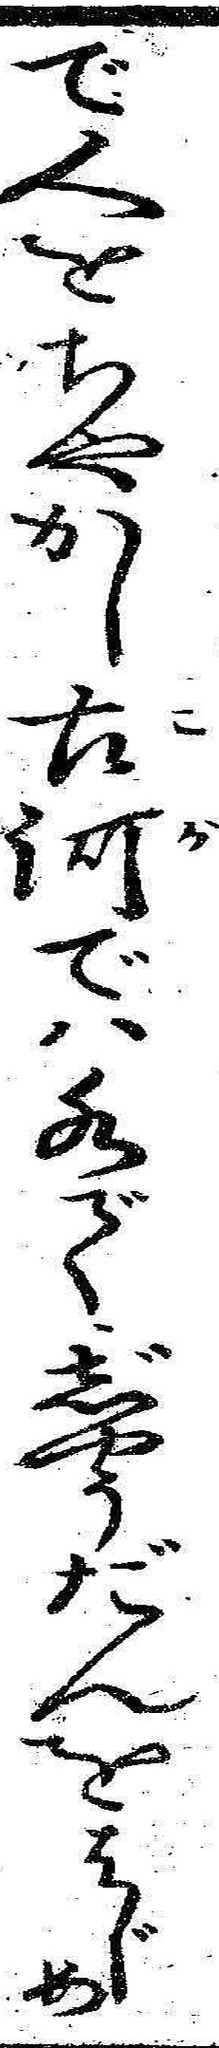で人をちやかし古河では水でじやうだんをはじめ

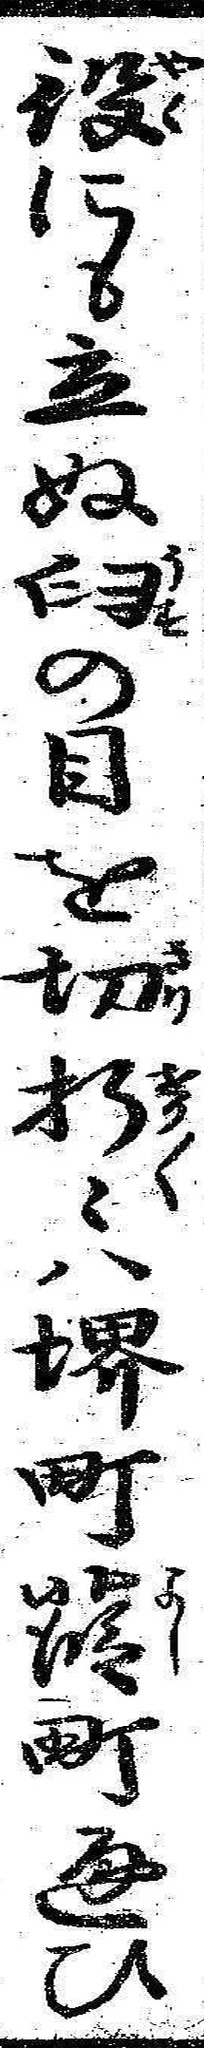役にも立ぬ臼の目を切折々は堺町葭町通ひ
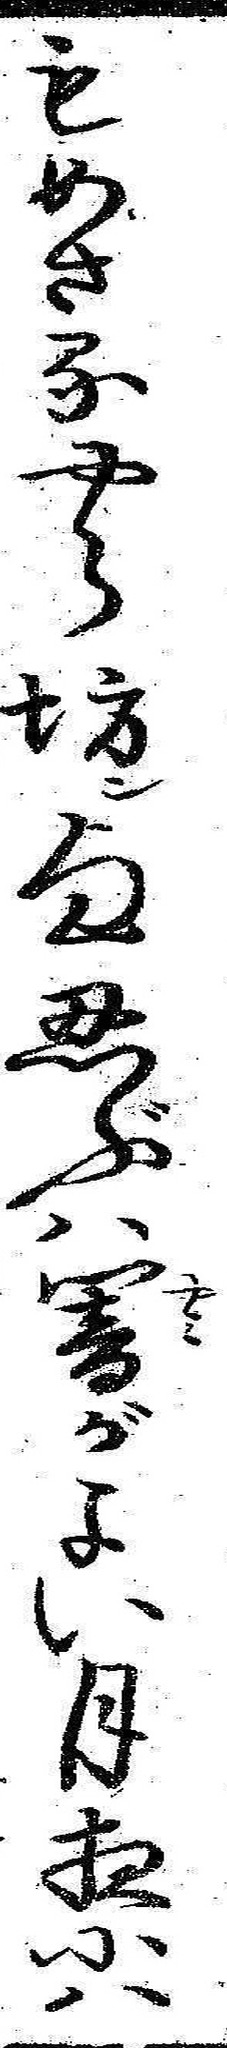もめさるやら坊様忍ぶは闇がよい月夜には
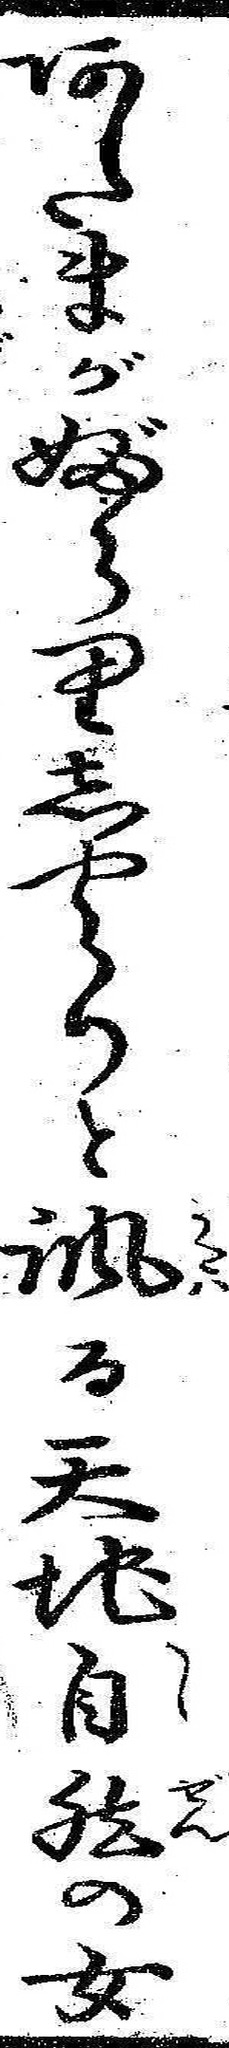あたまがぶらりしやらりと諷る天地自然の女
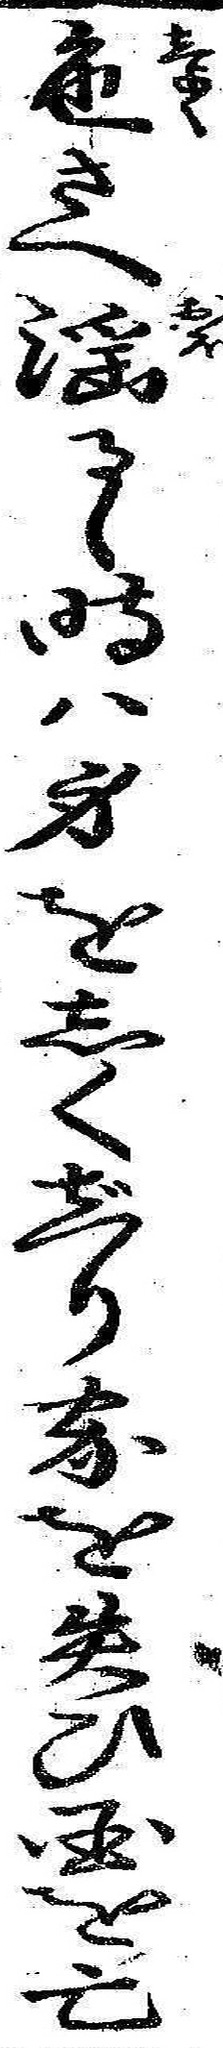色さへ淫るゝ時は身をしくじり家を失ひ国を亡
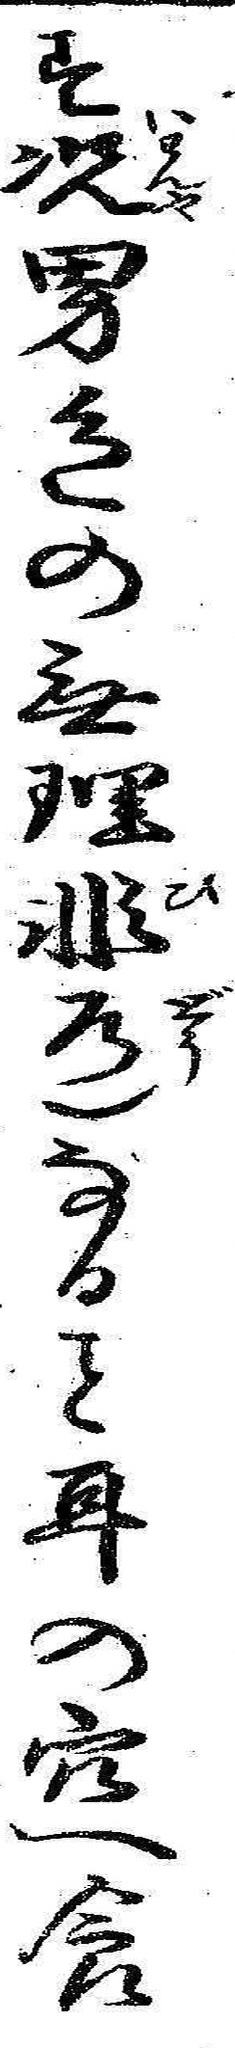す況男色の無理非道なること耳の穴へ食
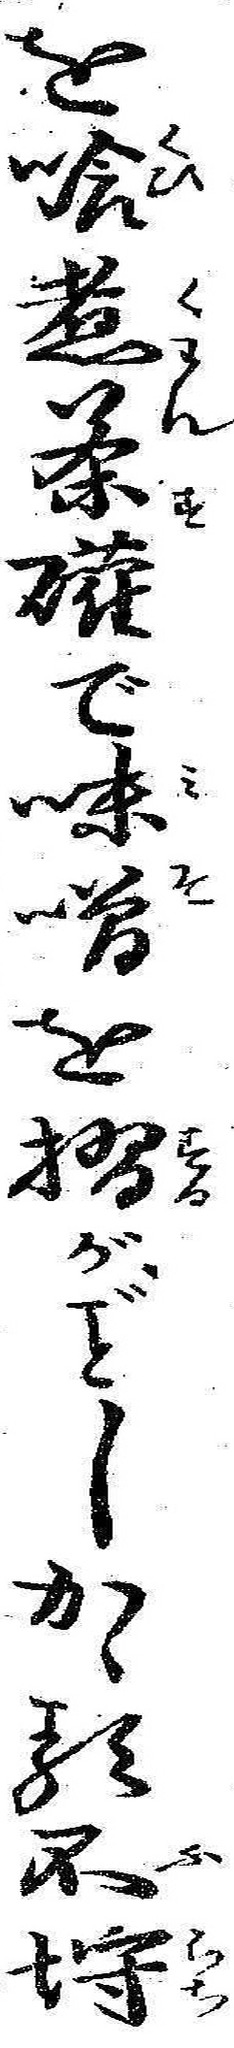を喰煮茶鑵で味噌を摺がごとしかゝる不埒
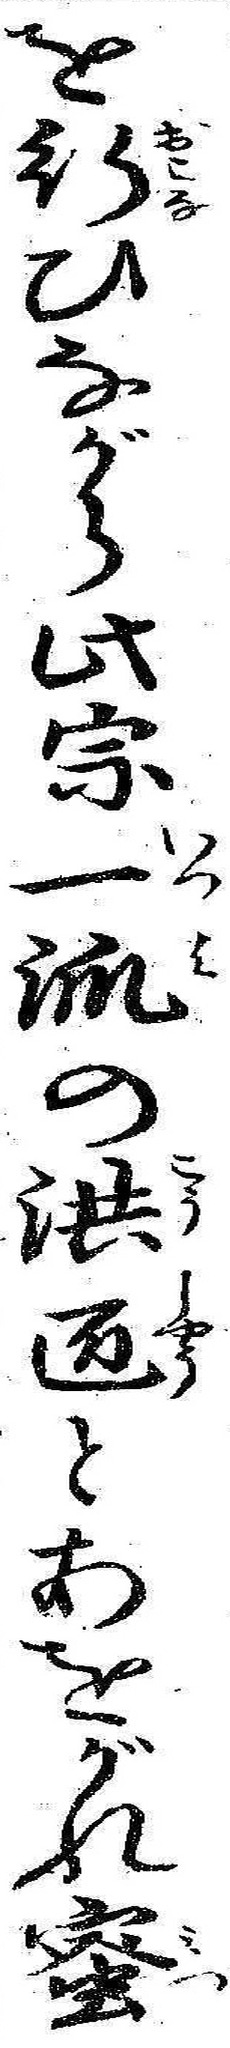を行ひながら此宗一派の洪匠とあをがれ蜜
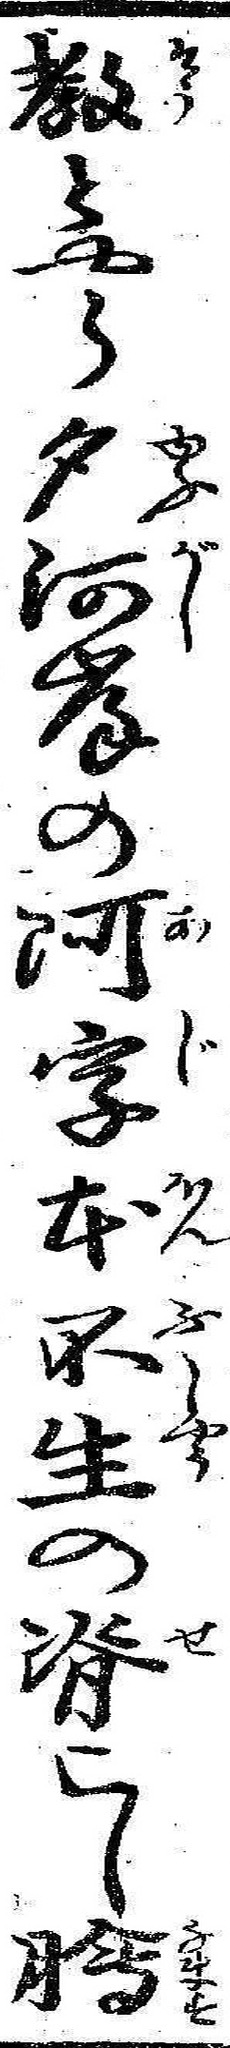教とやら夕河岸の阿字本不生の脊こし膾
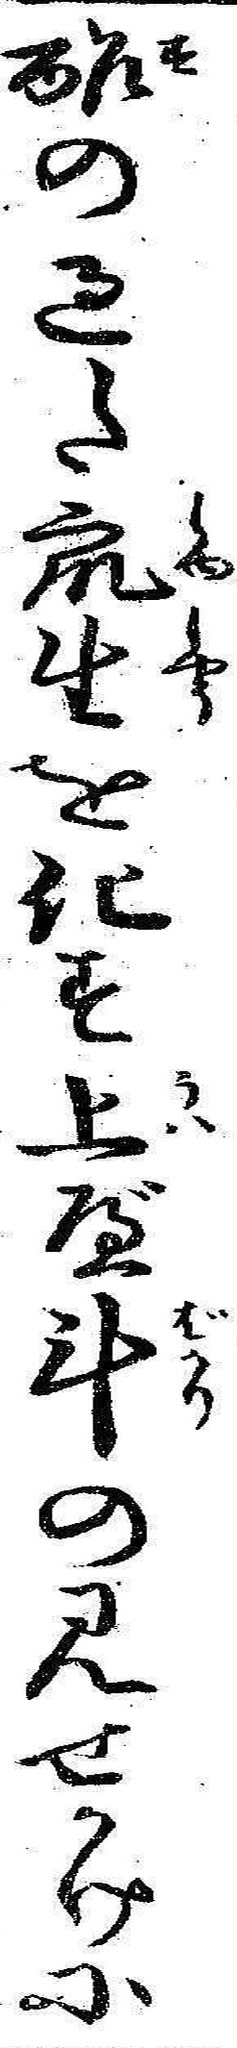酢の過た衆生を化す上べ計の見せかけに
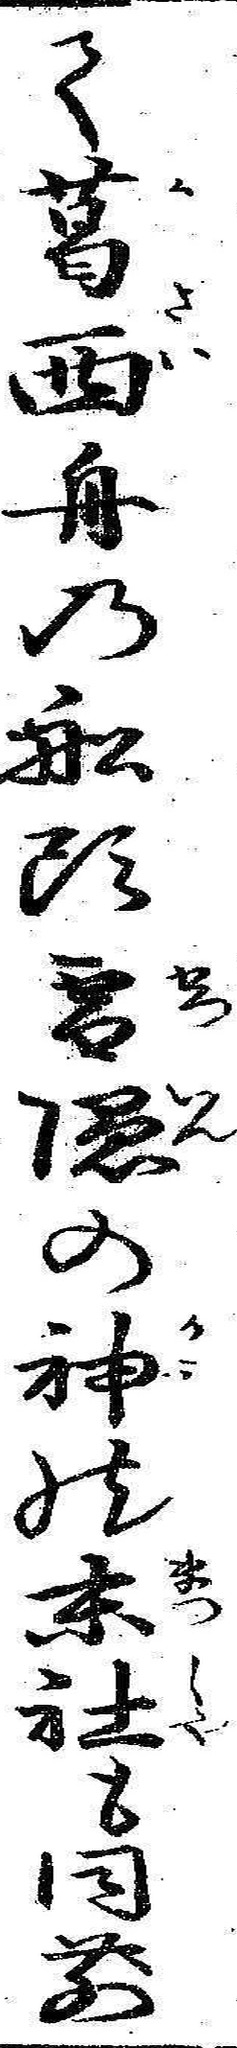て葛西舟の船頭雪隠の神の末社も同前
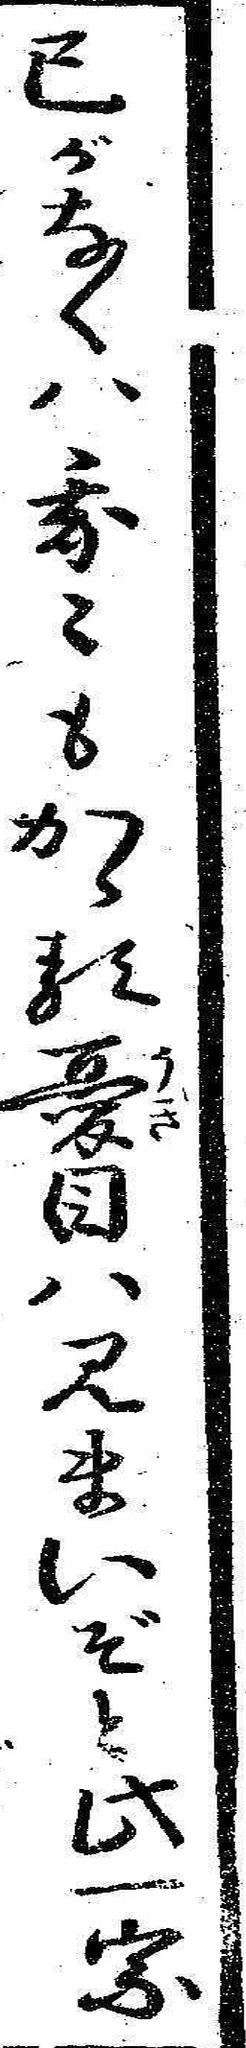巳がなくは我々もかゝる憂目は見まいぞと此一宗
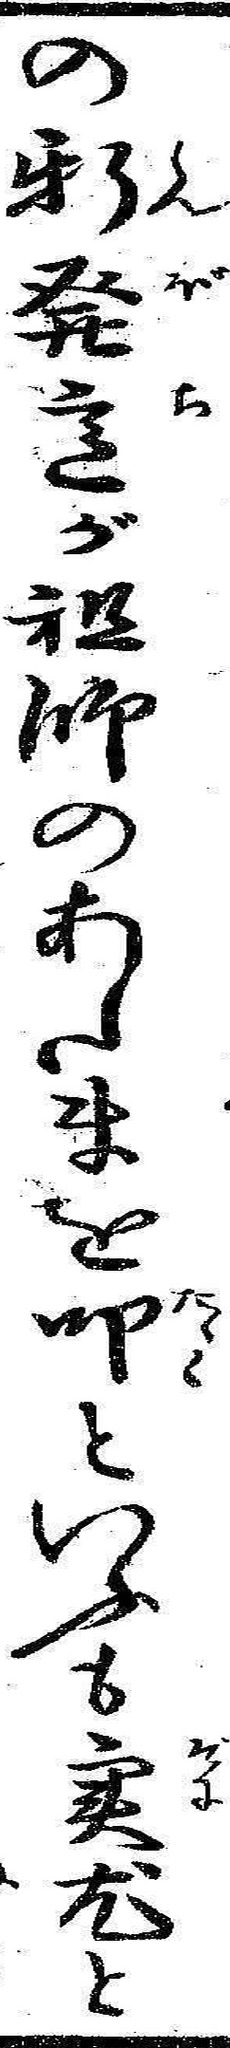の新発意が祖師のあたまを叩といふも実尤と
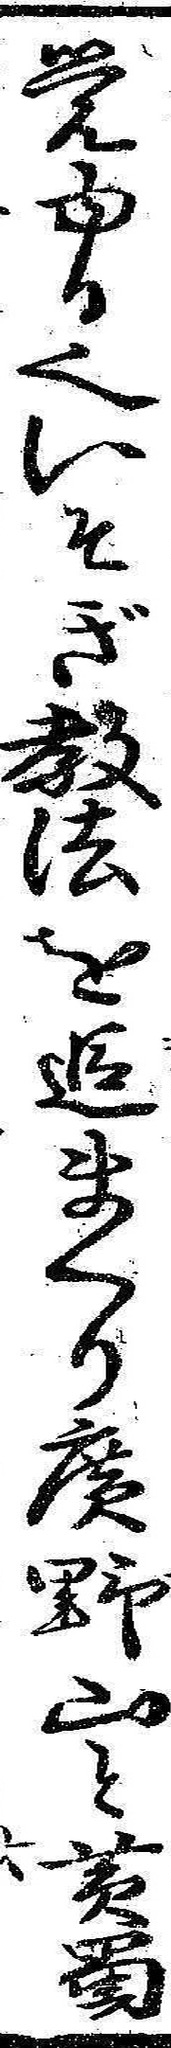覚ゆる也いそぎ教法を追まくり広野山と黄蜀
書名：根無草後編
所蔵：国文学研究資料館
